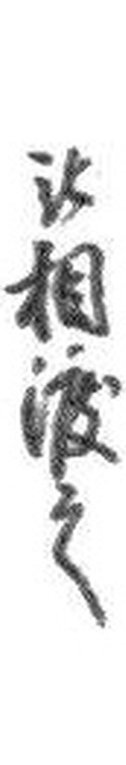被相渡之
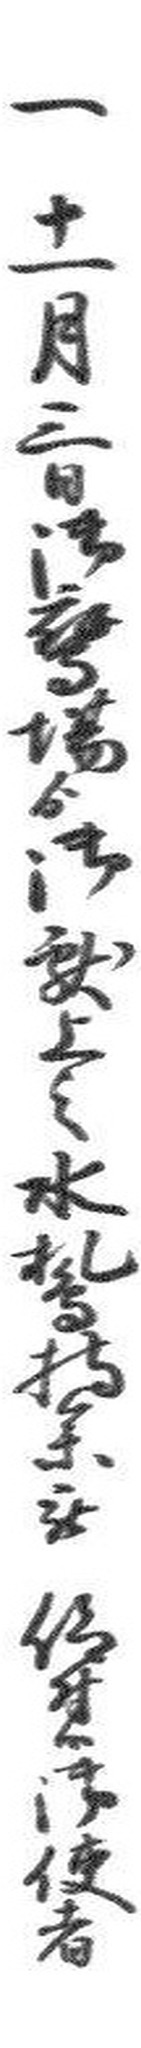一十一月三日御鷹場ゟ御献上之水𩿤持参被仰付候御使者

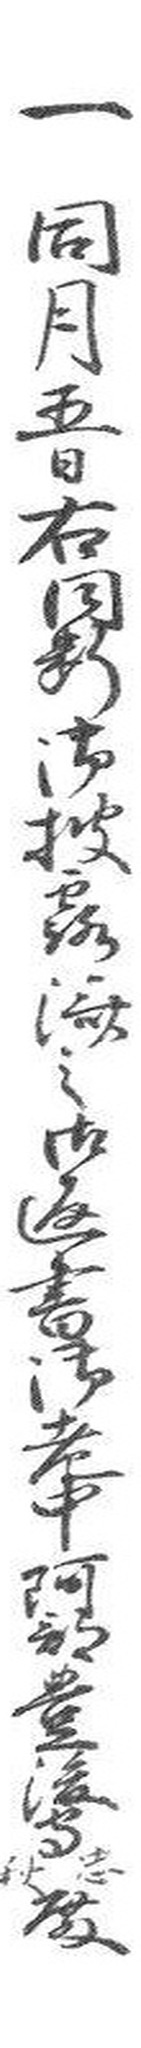一同月五日右同断御披露済之御返書御老中阿部豊後守忠秋殿
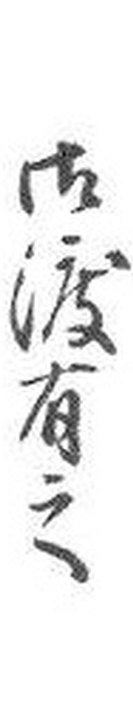御渡有之
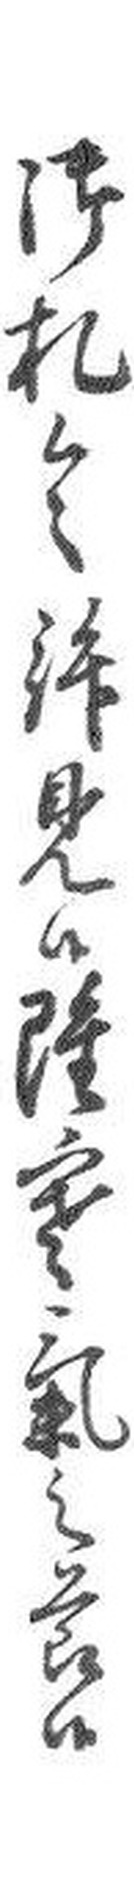御札令拝見候雖寒気之節候
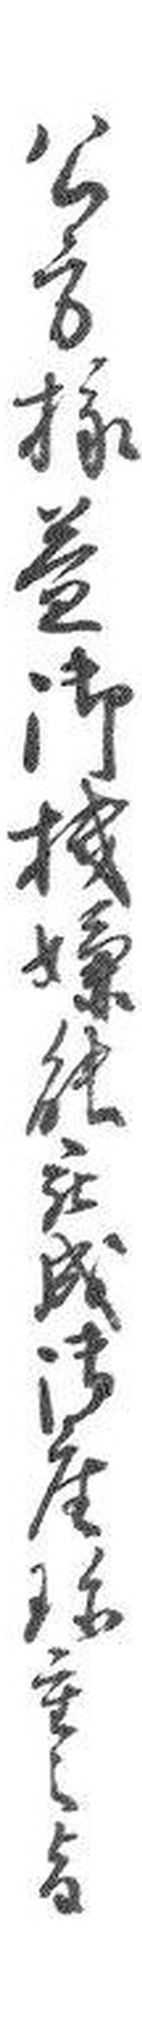公方様益御機嫌能被成御座珍重之旨
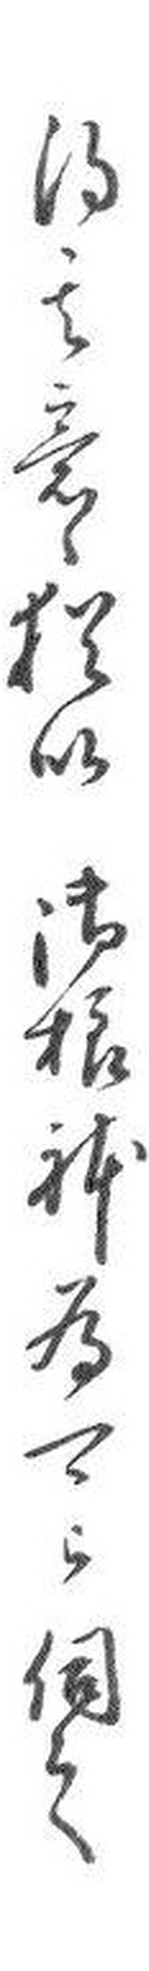得其意候猶以御様体為可被伺之
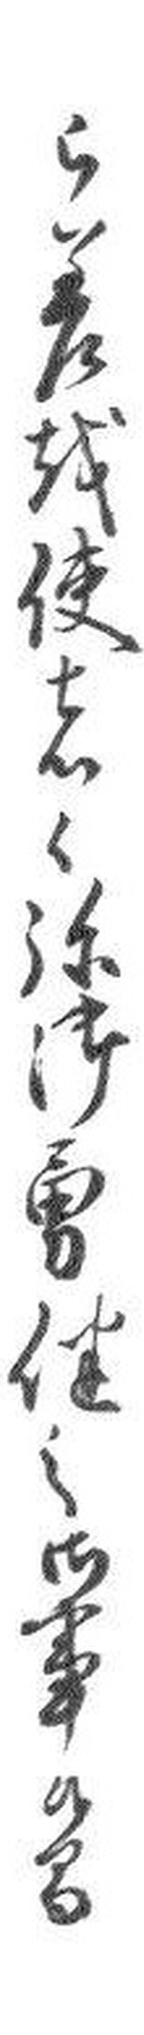被差越使者候弥御勇健之御事候間
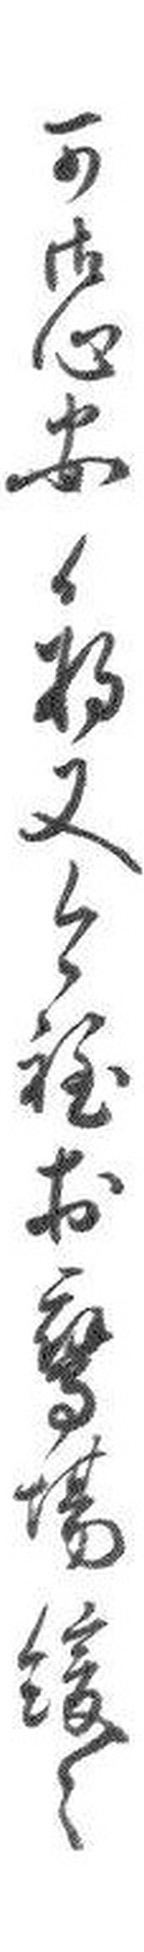可御心安候将又今程於鷹場緩々
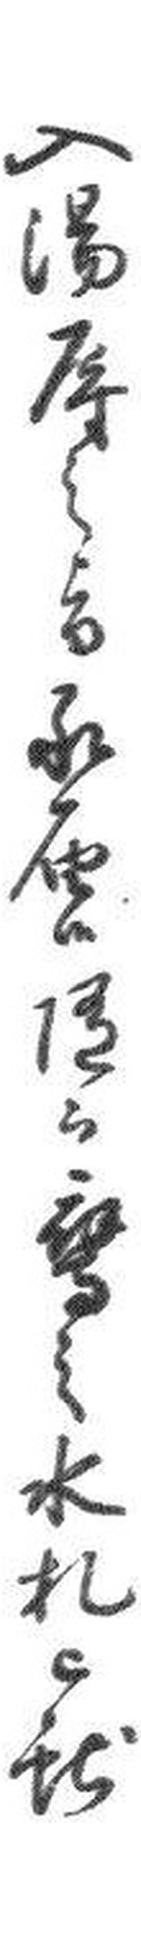入湯辱之旨承届候随而鷹之水札被献
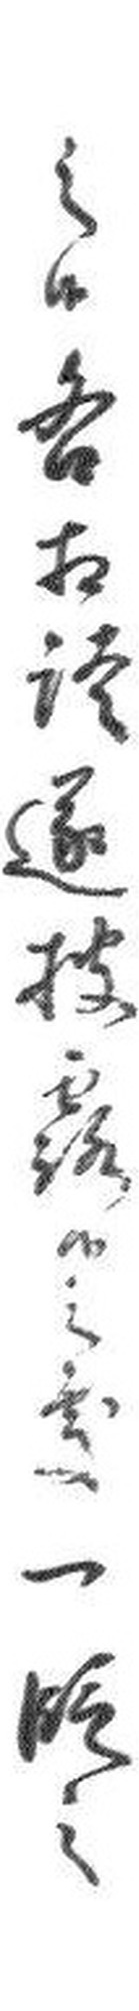之候各相談遂披露候之処一段之
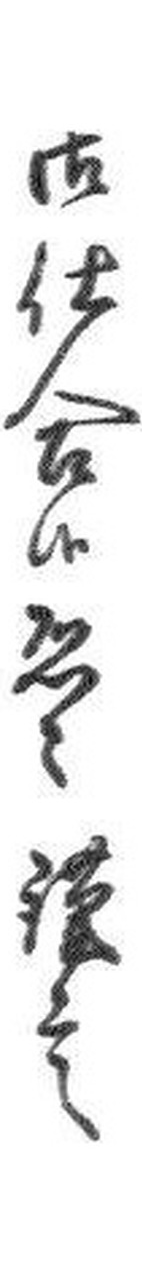御仕合候恐々謹言
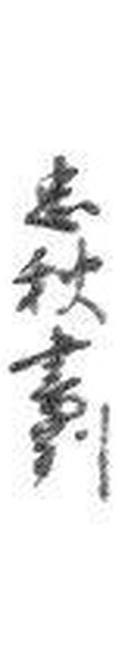忠秋書判
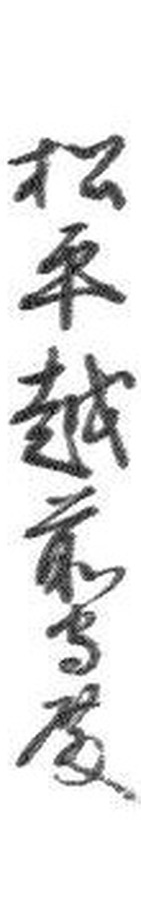松平越前守殿
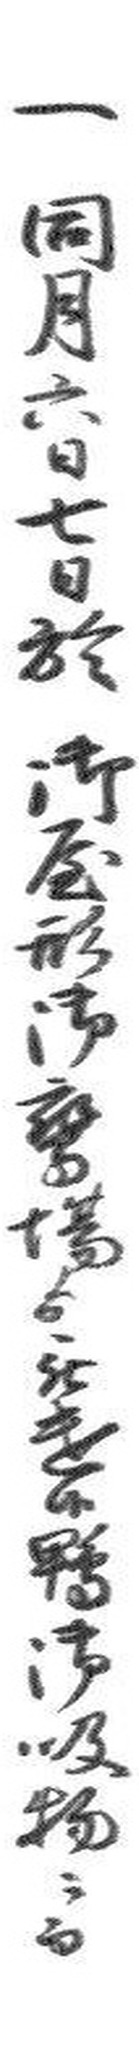一同月六日七日於御屋形御鷹場ゟ被遣候鴨御吸物ニ而

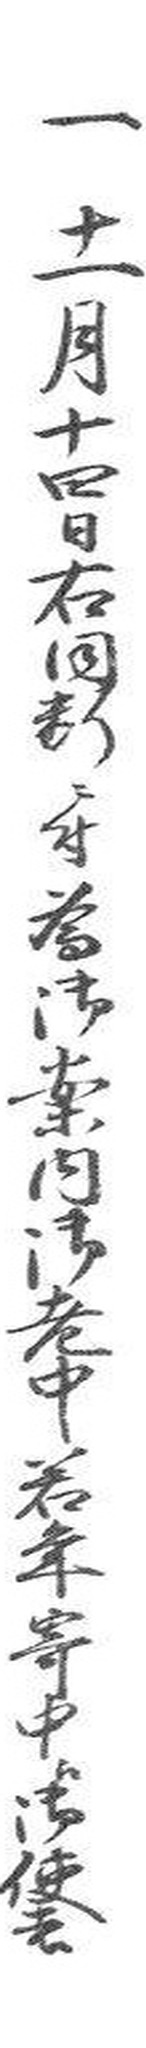一十一月十四日右同断ニ付為御案内御老中若年寄中江御使者
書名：家譜 七 光通公 従寛文四年到同九年
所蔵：福井県文書館 Fukui Prefectural Archives
